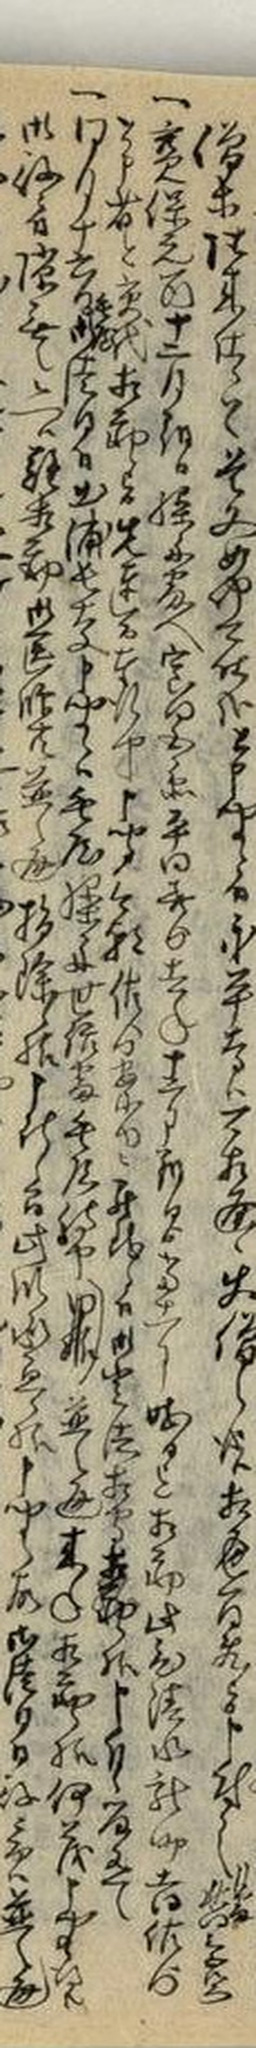と申者と交代相勤候旨先達て奉行中申聞今朝佐右衛門案内に罷越候に付御定法相守相勤候様申付候留有之
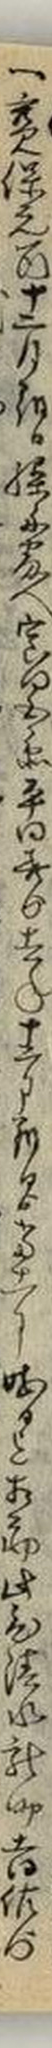一寛保元酉十二月朔日繰舟番人室田五兵衛平田喜右衛門去年十二月朔日ゟ当十一月晦日迄相勤此度清水新助土田佐右衛門
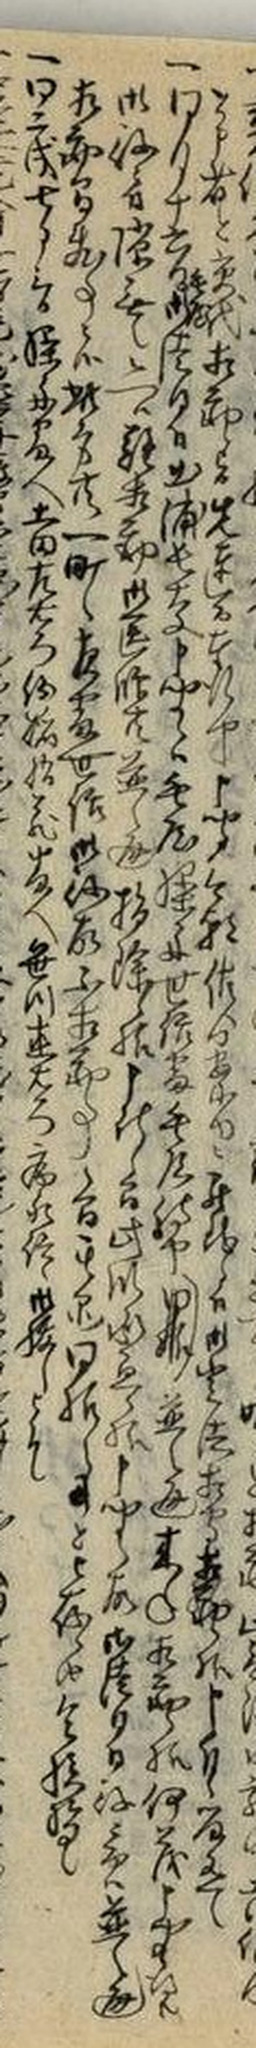御役に付隙無之候へは難相勤御医師共並之通指除候様申断候間此段承置候様申聞候故御徒目付役にては並之通
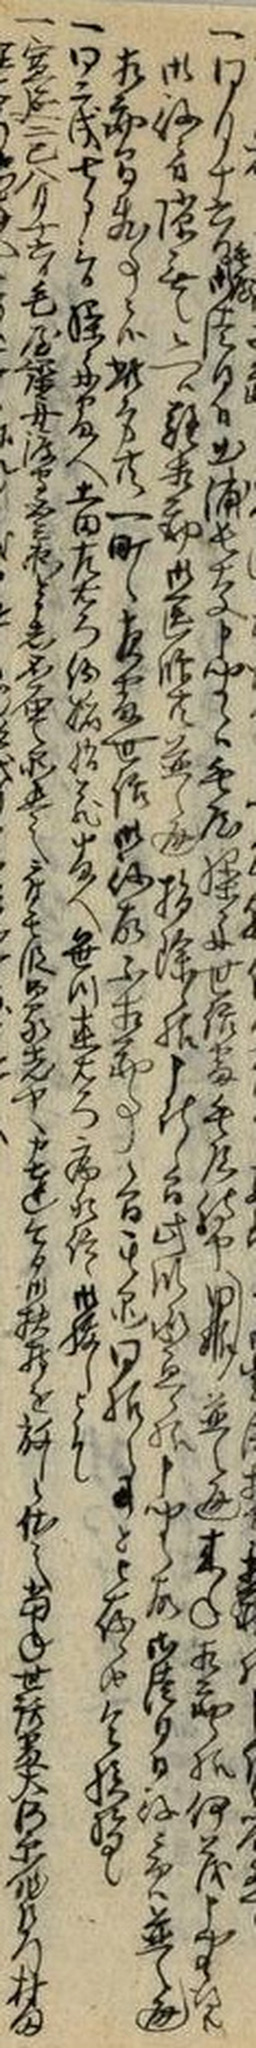相勤間敷事に候此方共一町へ夜番世話御役故不相勤事候間其品同様之事と被存候由令挨拶候
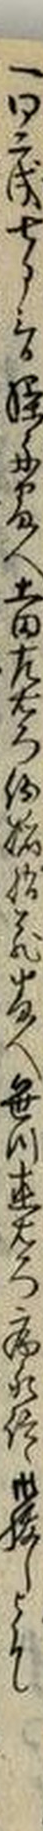一同二戌七月三日繰舟番人土田左右衛門儀㷔硝蔵番人笹川直右衛門病死跡へ御援し被下候
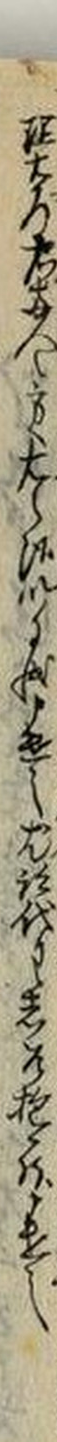理右衛門右両人之方へ右之趣以手紙申遣之尤跡代り之者召抱候様申遣之

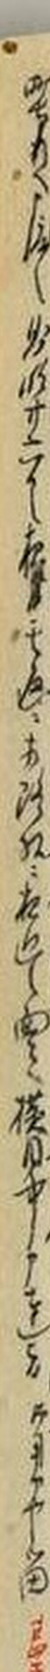町奉行へ申渡之則明廿六日之夜ゟ其通に相改候様に夜廻之面々へ横目中申達旨御用部や留
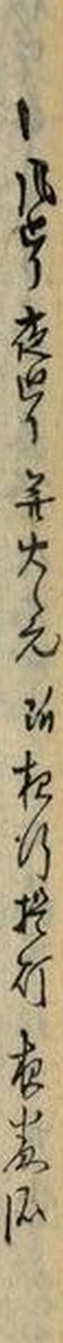風廻り夜廻り并火之元附夜行提灯夜番所
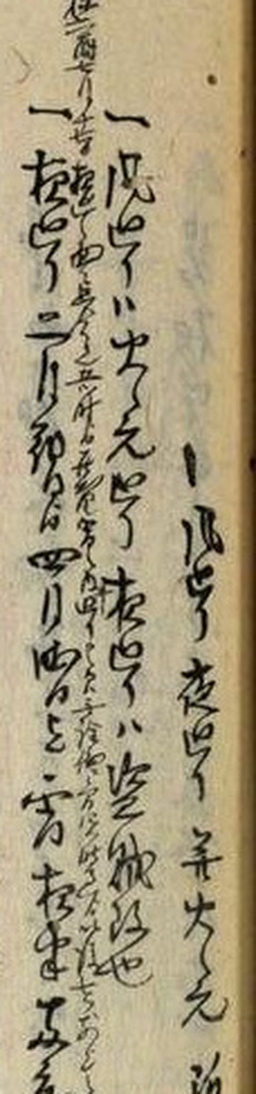一風廻りは火之元廻り夜廻りは盗賊改也
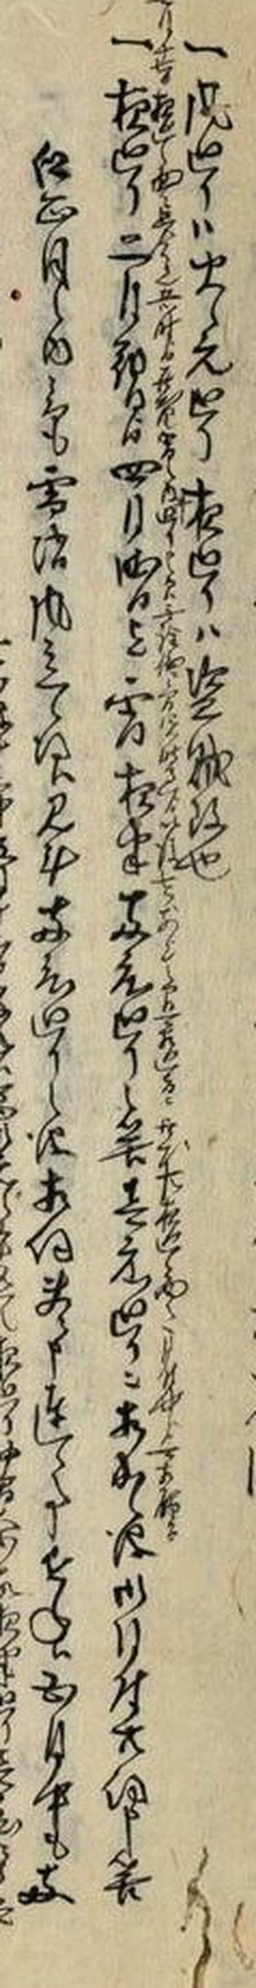一夜廻り二月朔日ゟ四月晦日迄宵夜半両度廻り之筈壱度廻りに相成候儀御目付共伺申筈
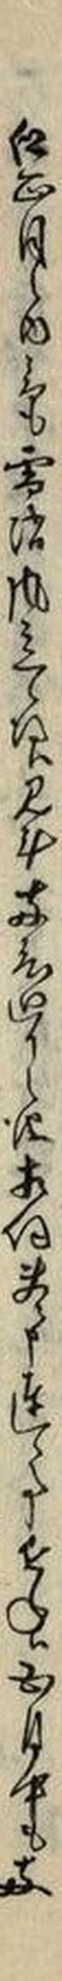但正月之内にても雪消風立候得は見斗両度廻り之儀相伺夫々申達候事近年は五月中も両
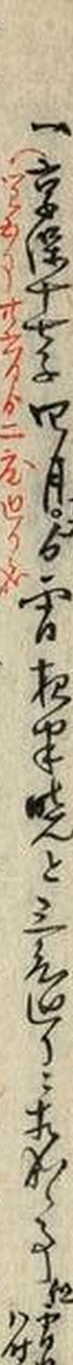一享保十七子四月◦十六日ゟ宵夜半暁と三度廻りに相成候事
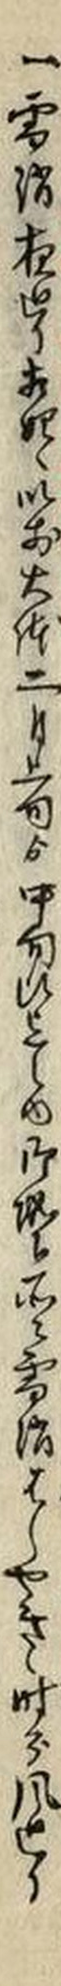一雪消夜廻り相始候以前大体二月上旬ゟ中旬比迄之内御城下所々雪消はしやき候時分風廻り
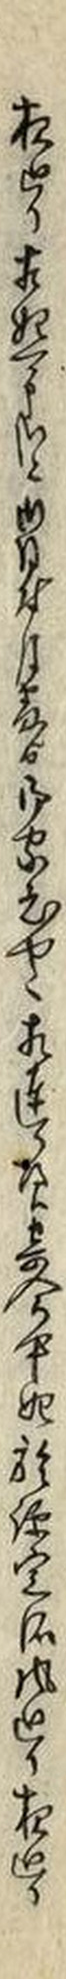夜廻り相始可申哉と御目付月番ゟ御家老中へ相達候得は寄合中始於評定所風廻り夜廻り
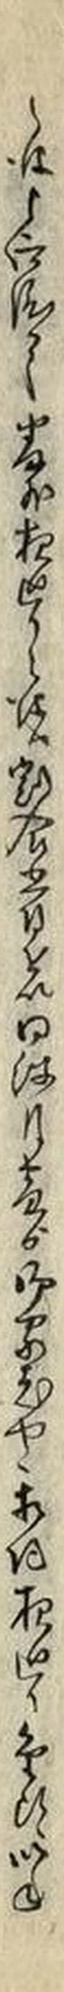之儀被仰渡之番外夜廻り之儀は割合書付を以同役月番ゟ御家老中へ相伺夜廻り筆頭へ以手
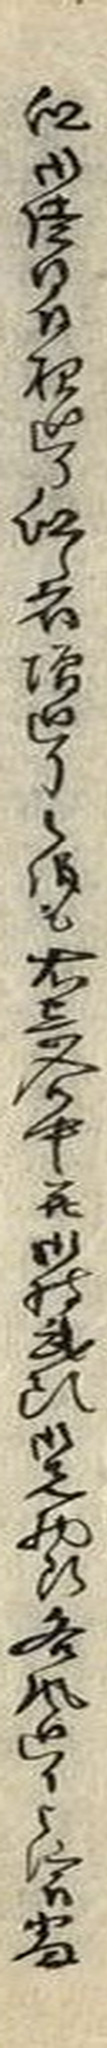但御徒目付夜廻り組之者増廻り之儀も右寄合中并御持武頭御先物頭各風廻り被仰付番
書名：御城下諸事之部
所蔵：福井県文書館 Fukui Prefectural Archives
